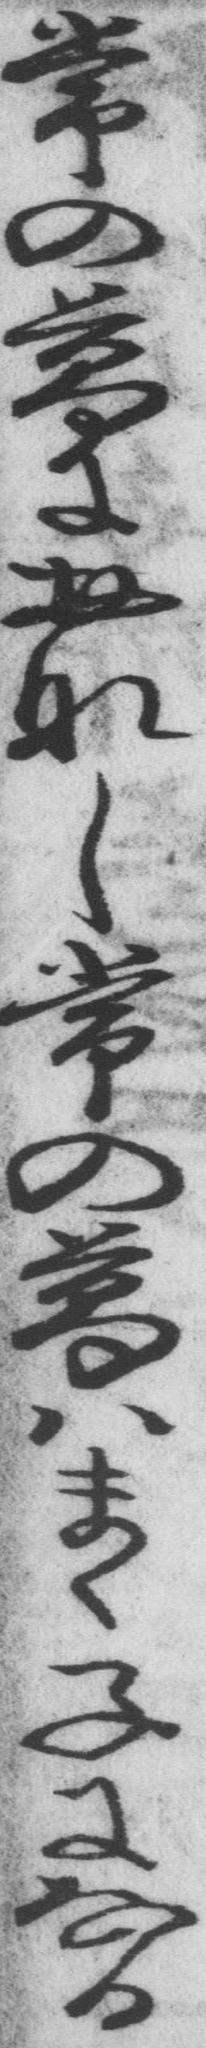常の葛におなし常の葛はまゝ子になる
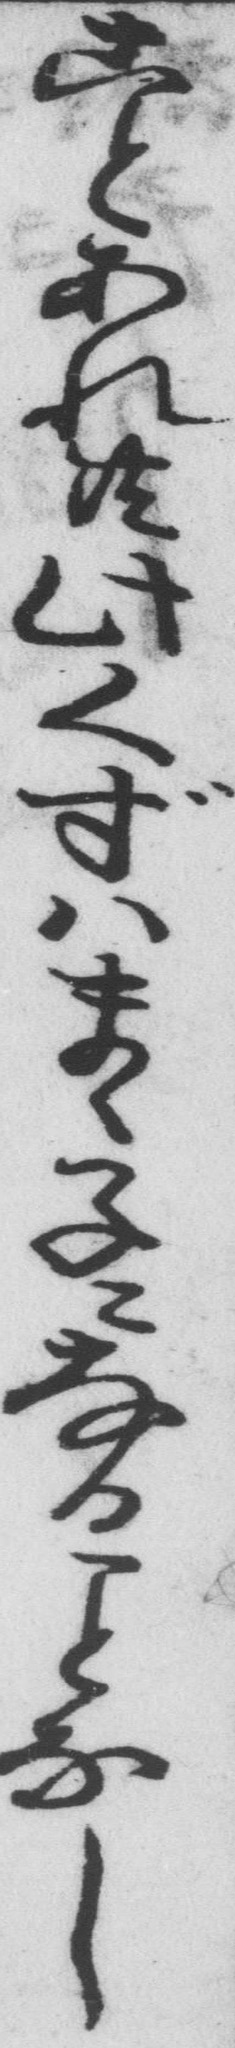ことあれ共此くずはまゝ子になることなし
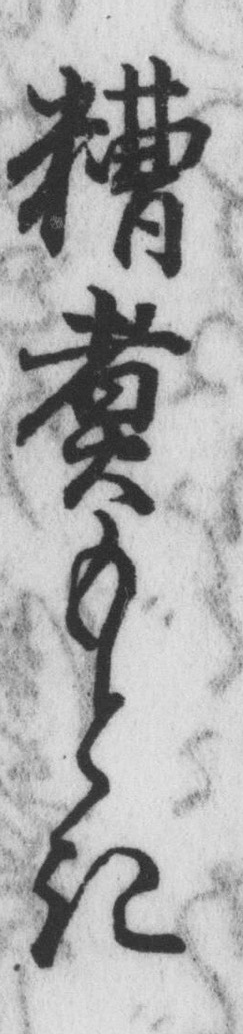糟煮もとき
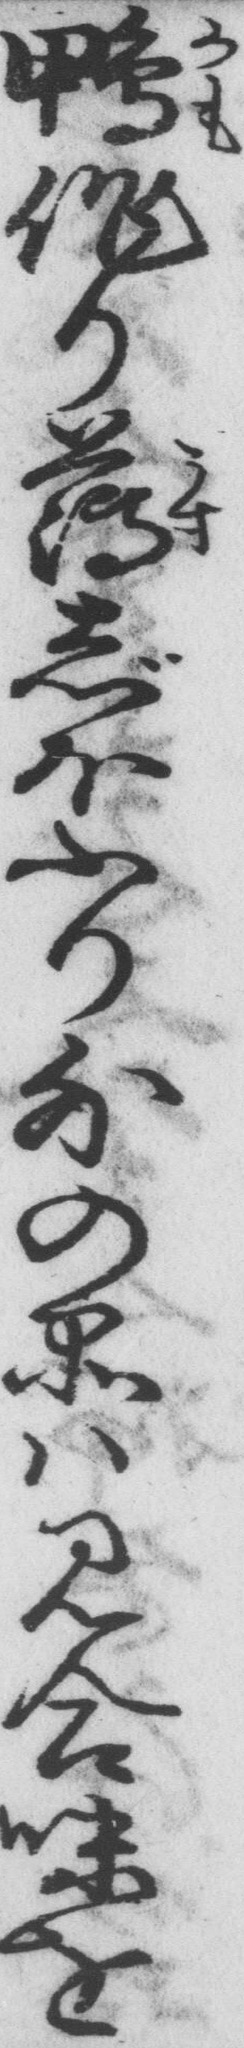鴨作り薄じほふり外の品は見合味を
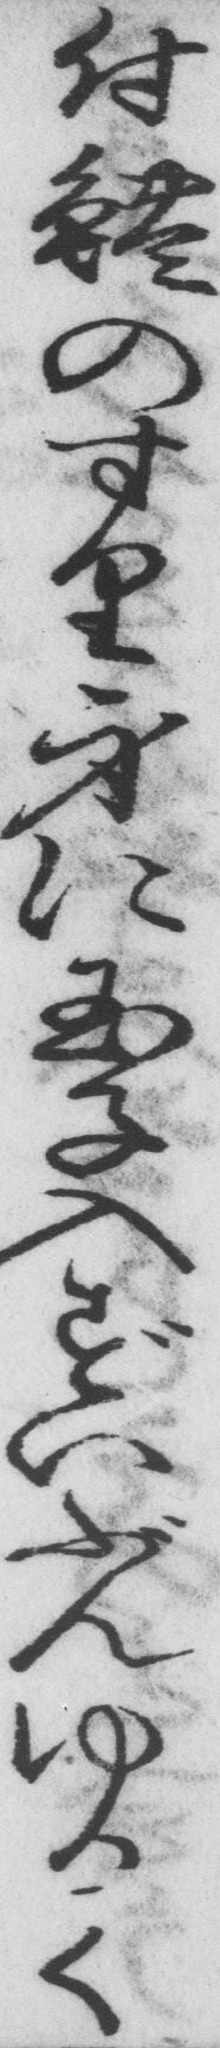付鱧のすり身に玉子入ずいぶんゆるく
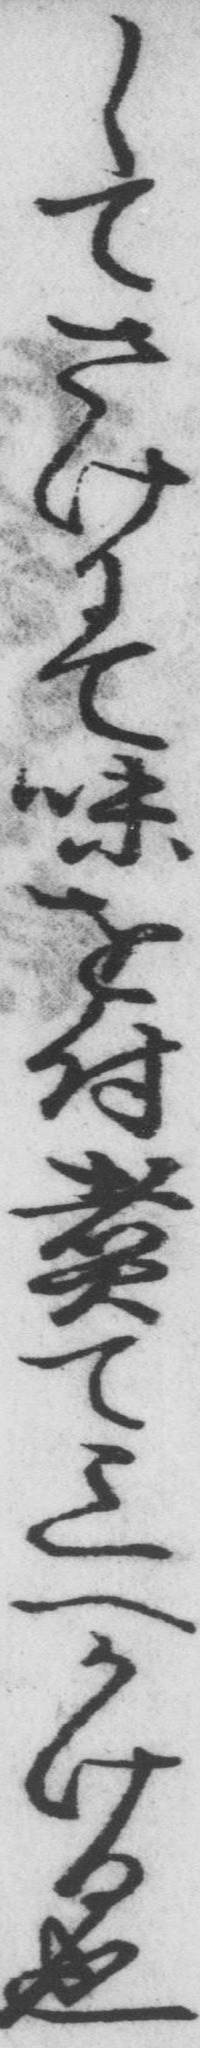してさけにて味を付煮て上へかける也
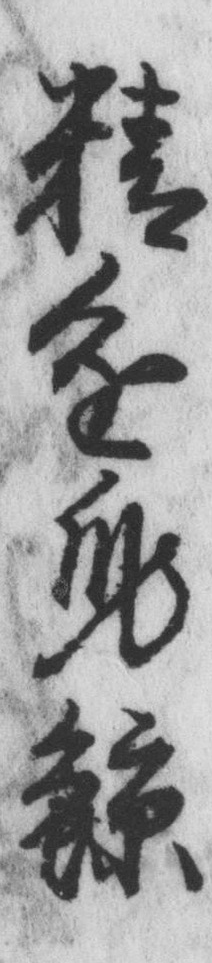精進身鯨
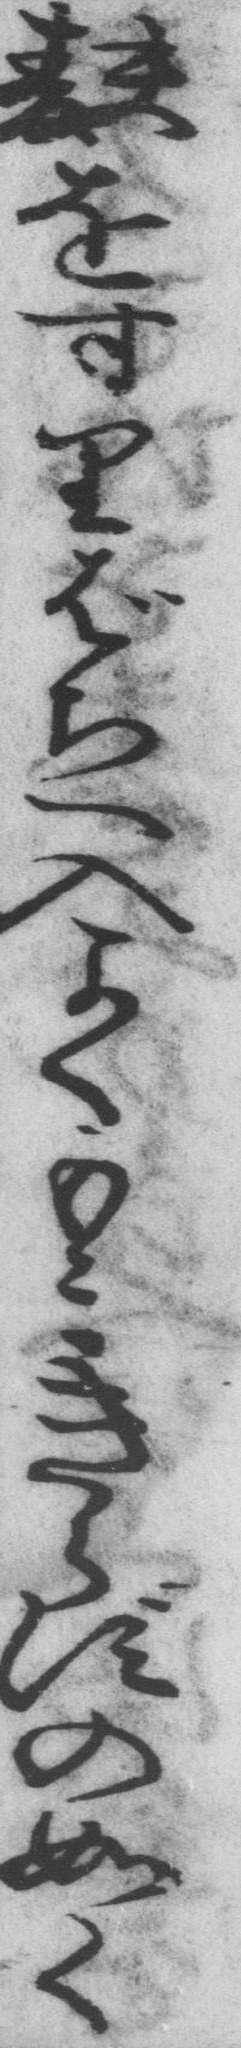麩をすりばちへ入よくもみきらずの如く

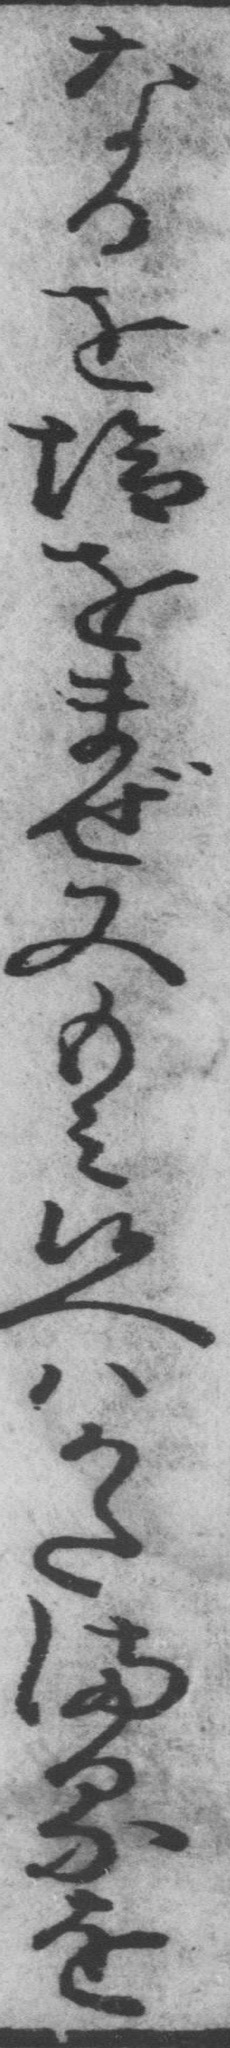なるを塩をまぜ又もみ候へはかたまるを
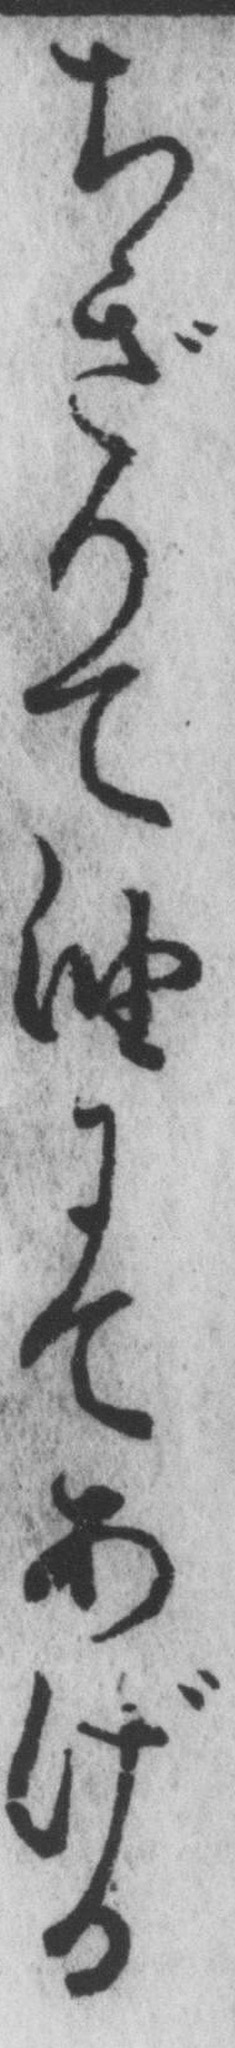ちぎりて油にてあげる
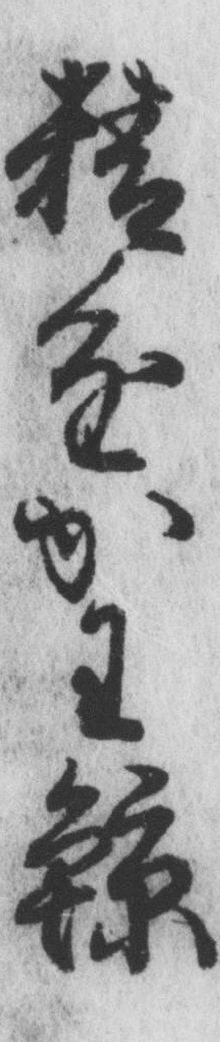精進かわ鯨
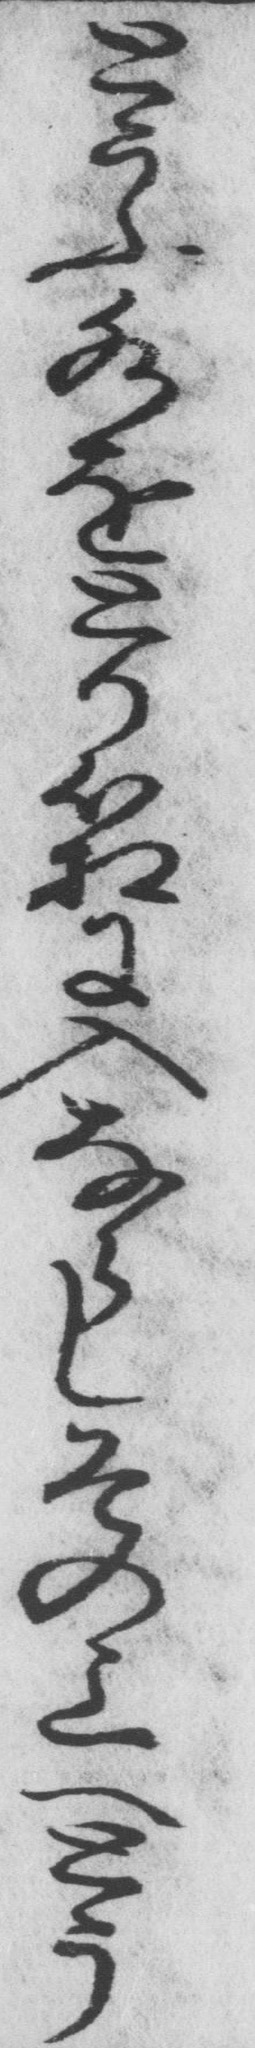とうふ水をとり箱に入ならしその上へとう
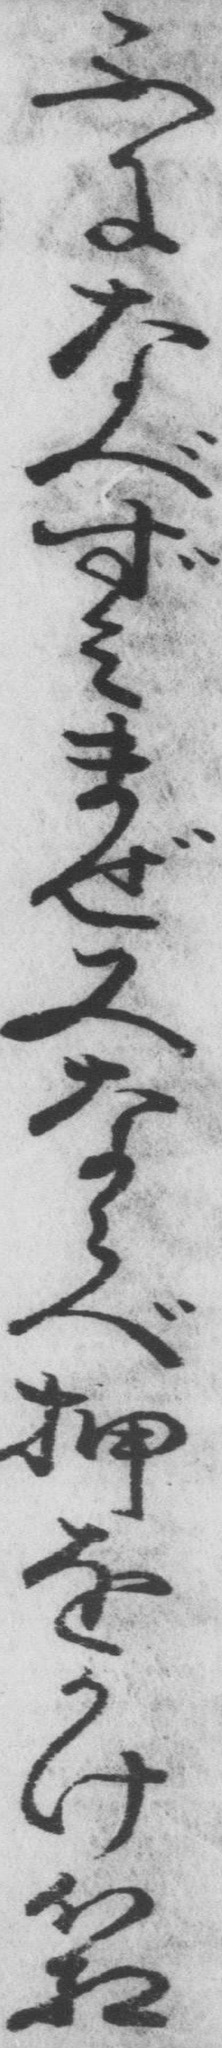ふになべずみまぜ又ならべ押をかけ箱
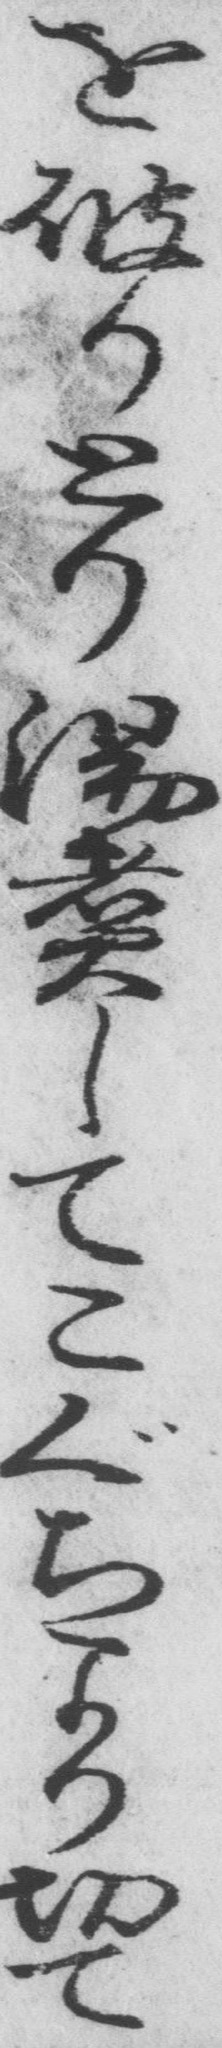を破りとり湯煮してこぐちより切て
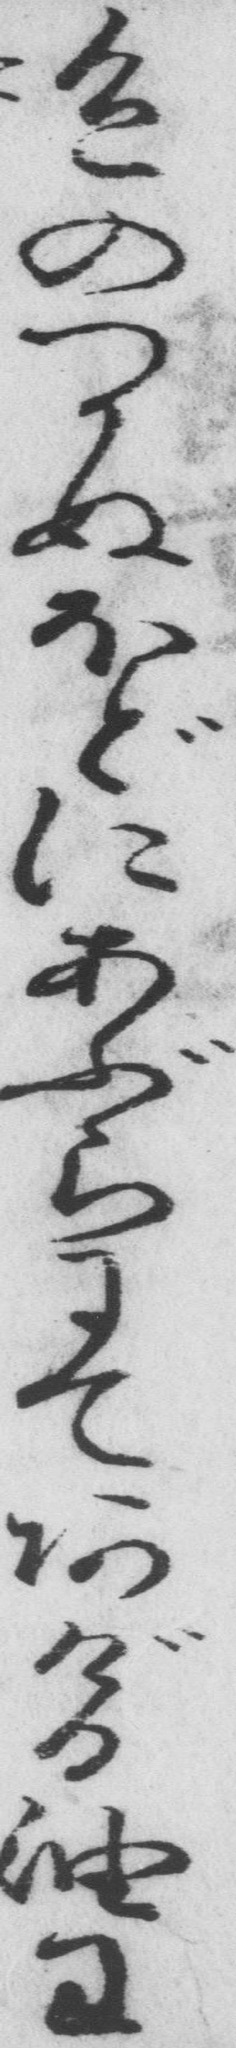色のつかぬほどにあぶらにてあげる油に
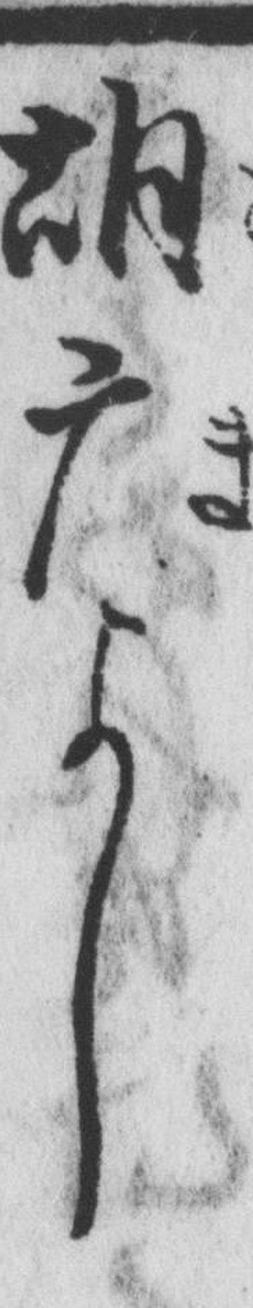胡麻よし
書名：料理山海郷
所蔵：大阪府立大学学術情報センター 国文学研究資料館
